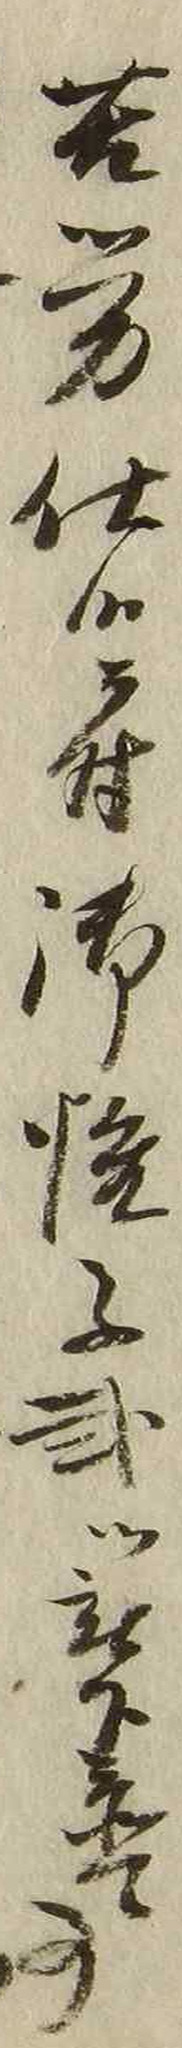苦労仕候ニ付御帷子弐ツ被下置候事
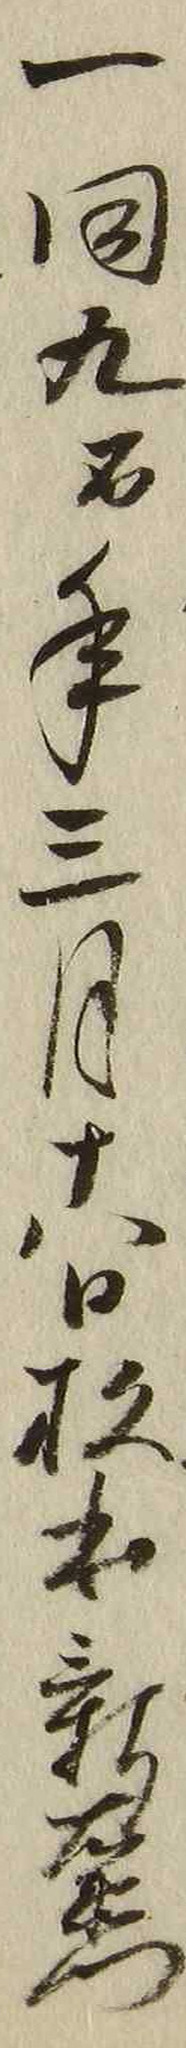一同九酉年三月十八日杉本新右衛門
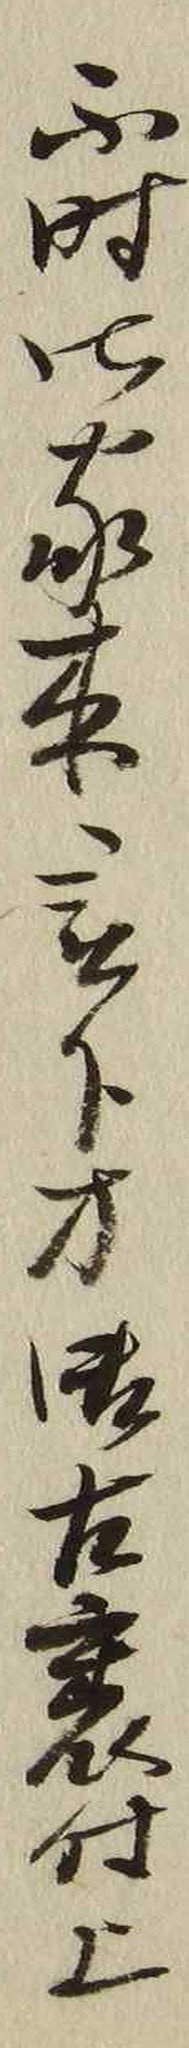不時御家来へ被下方御古裏付上
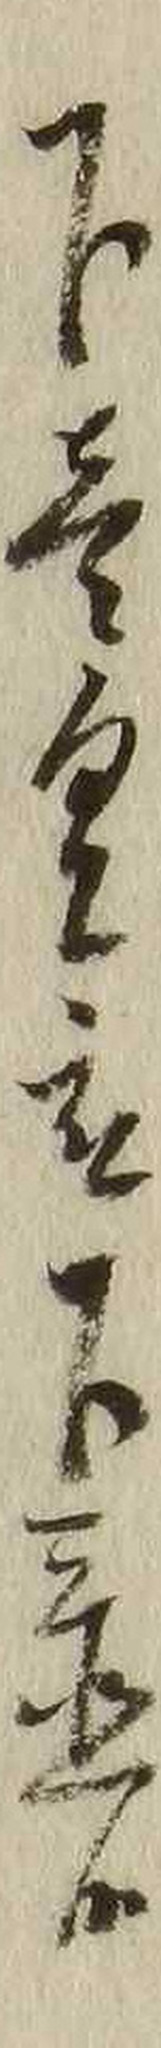下壱具被下置候
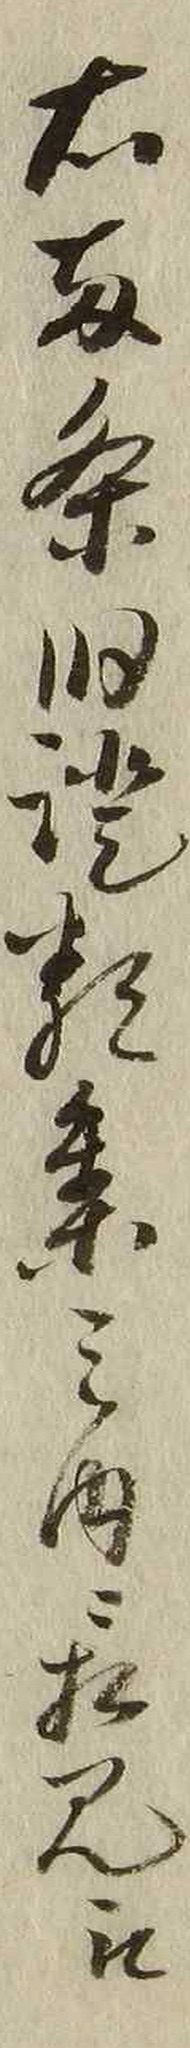右両条旧証類集之内ニ相見江
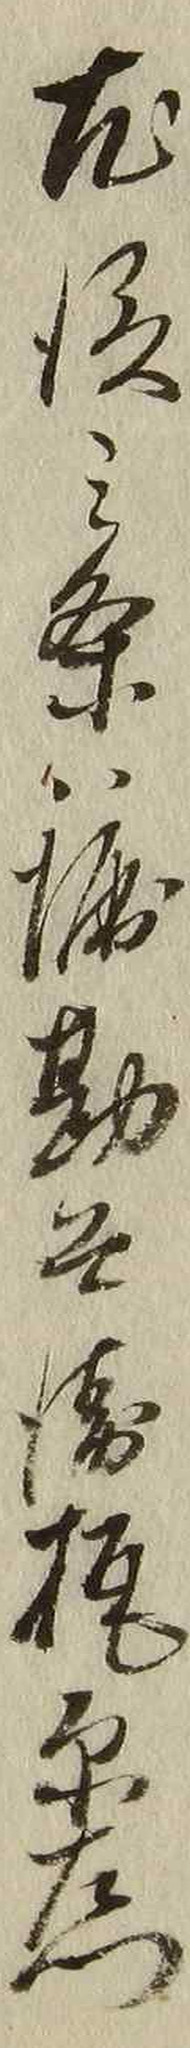尤後之条ハ堀勘兵衛梶原左門
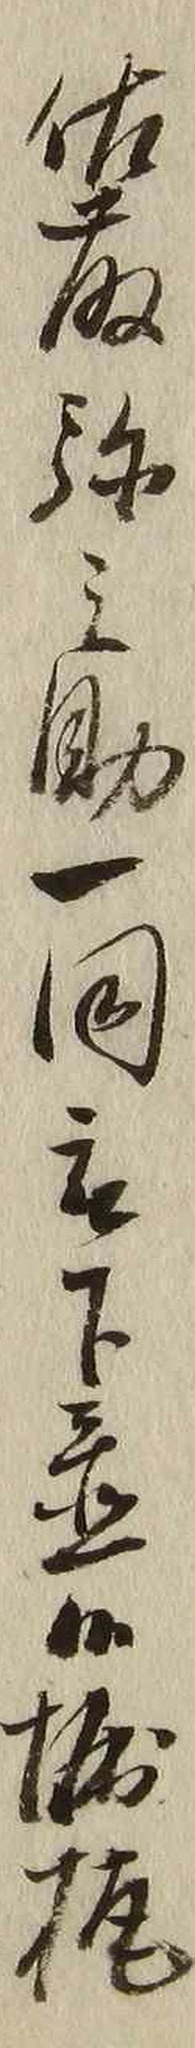佐藤弥之助一同被下置候堀梶
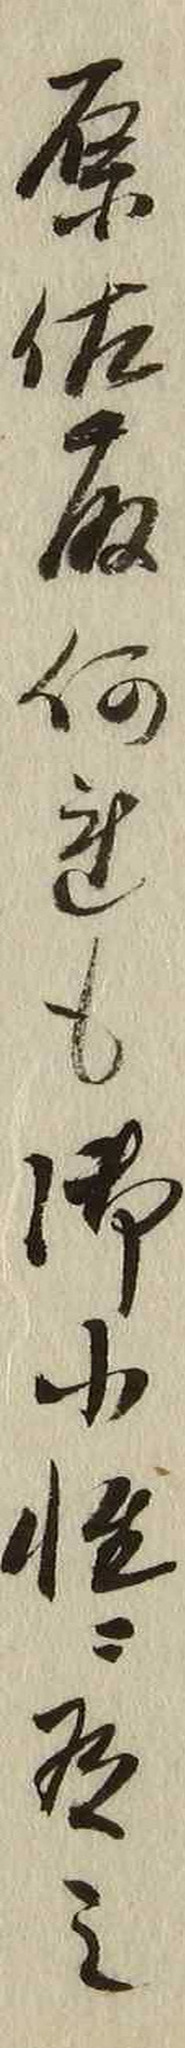原佐藤何れも御小性ニ有之
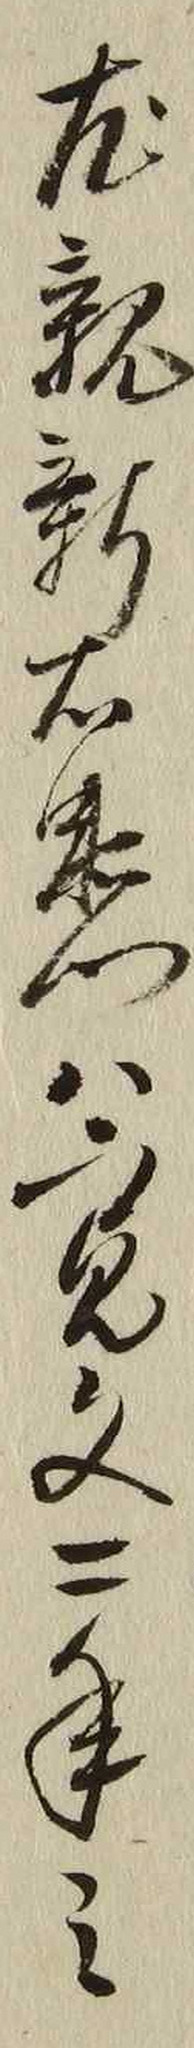尤親新右衛門ハ寛文二年之
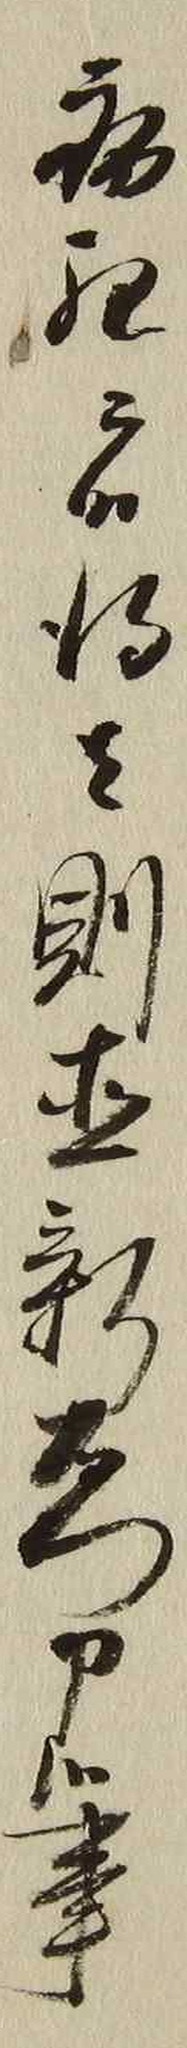病死ニ候得者則直新右衛門申候事
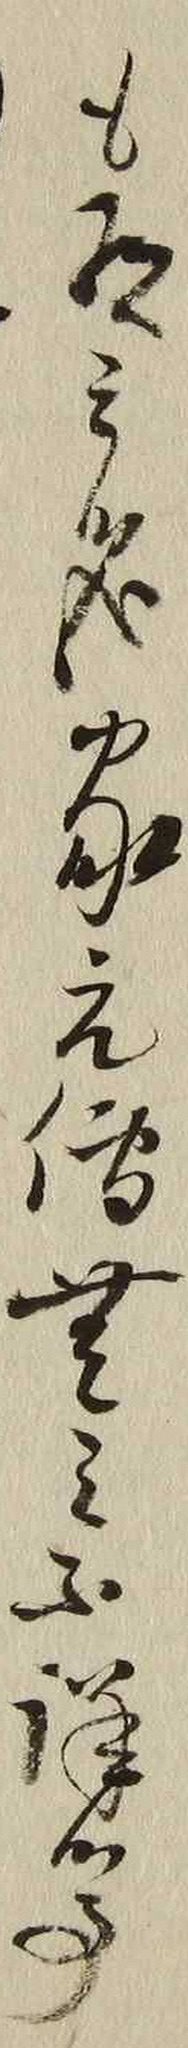も有之候哉家元伝無之不詳候事
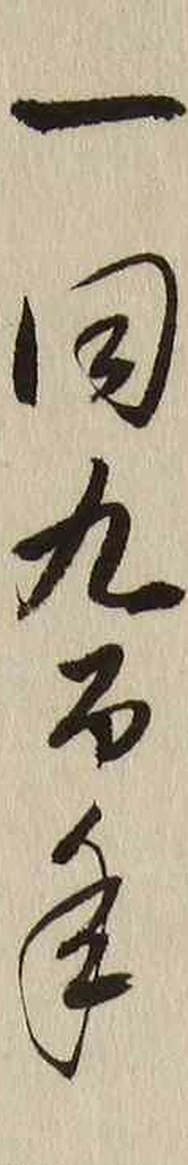一同九酉年
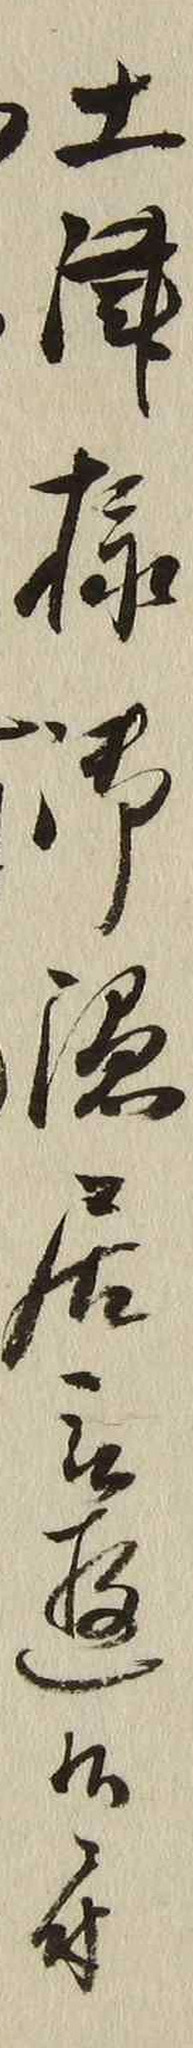土津様御隠居被遊候ニ付
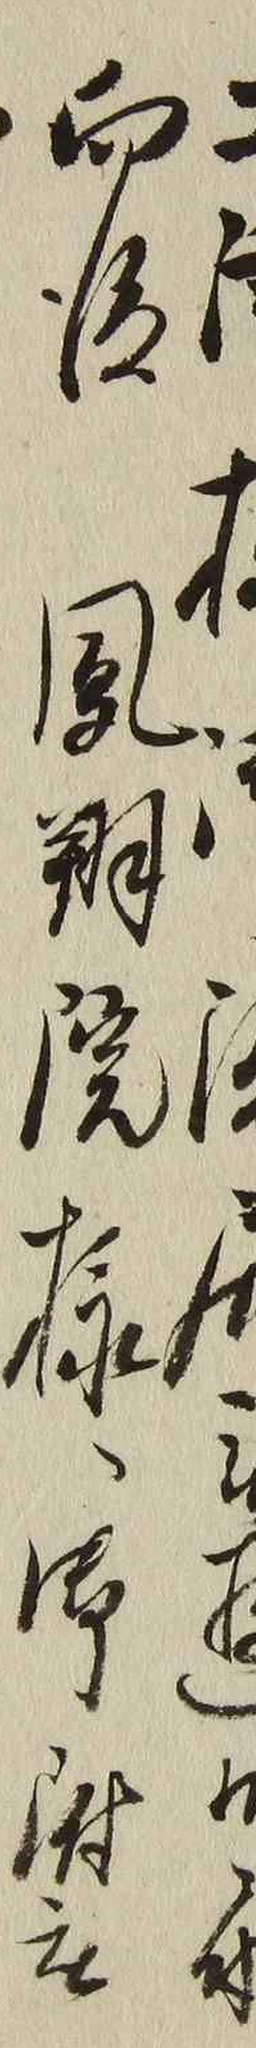向後鳳翔院様へ御附被
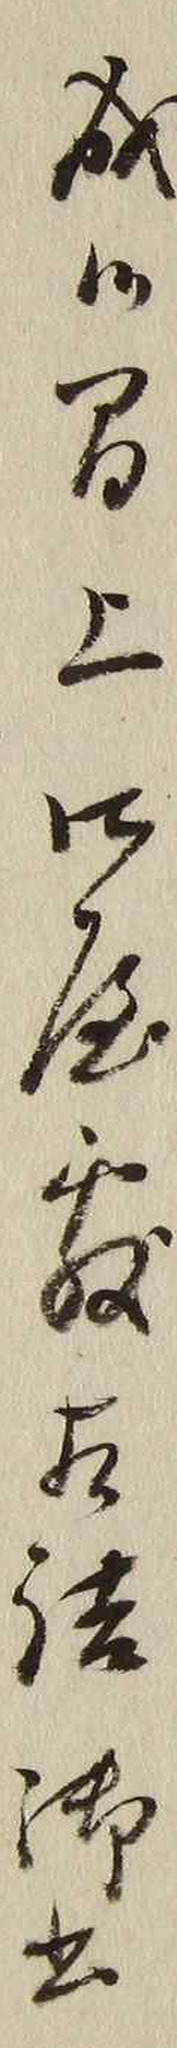成候間上御屋敷相詰御書
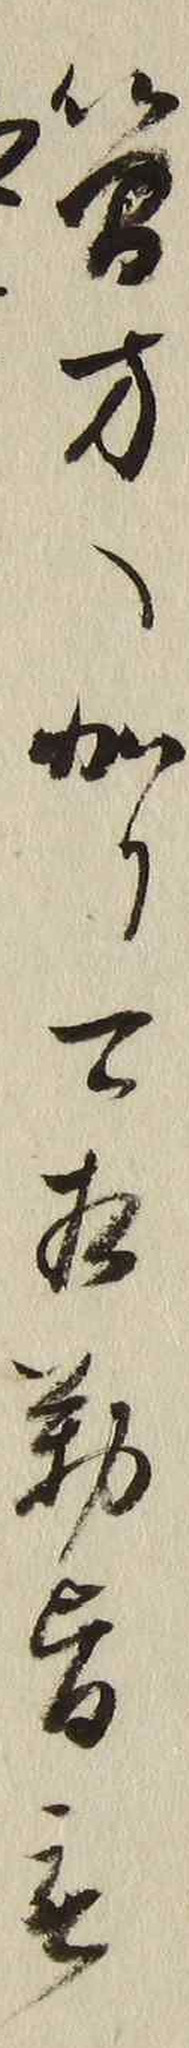簡方へ加り可相勤旨被
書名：諸士系譜　巻之355　す之部5
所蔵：会津若松市立会津図書館
